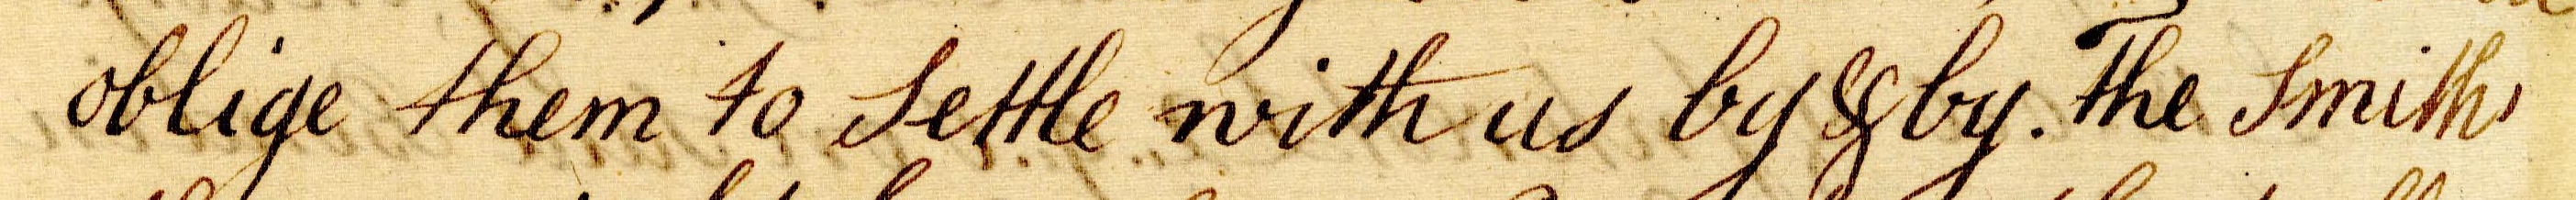oblige them to Settle with us by & by. The Smith
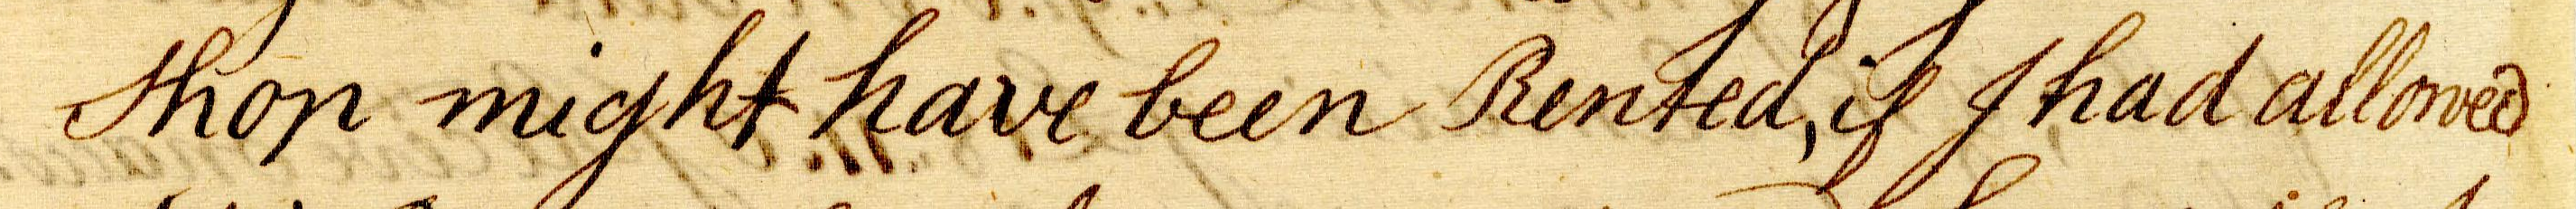shop might have been Rented, if I had allowed
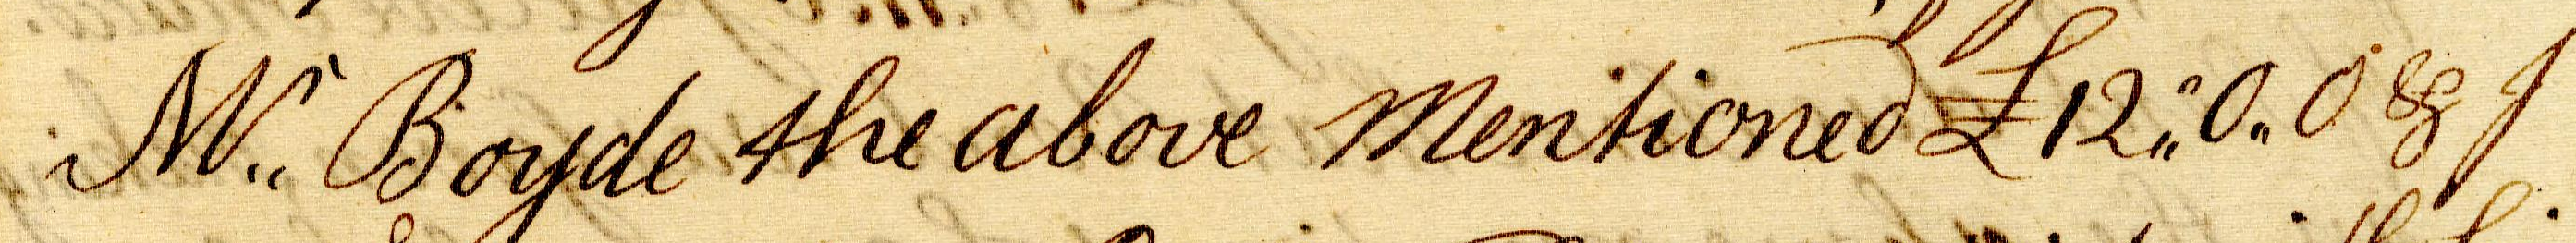M^r.. Boyde the above Mentioned £12..0..0 & I
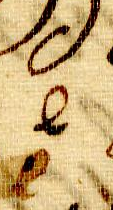e
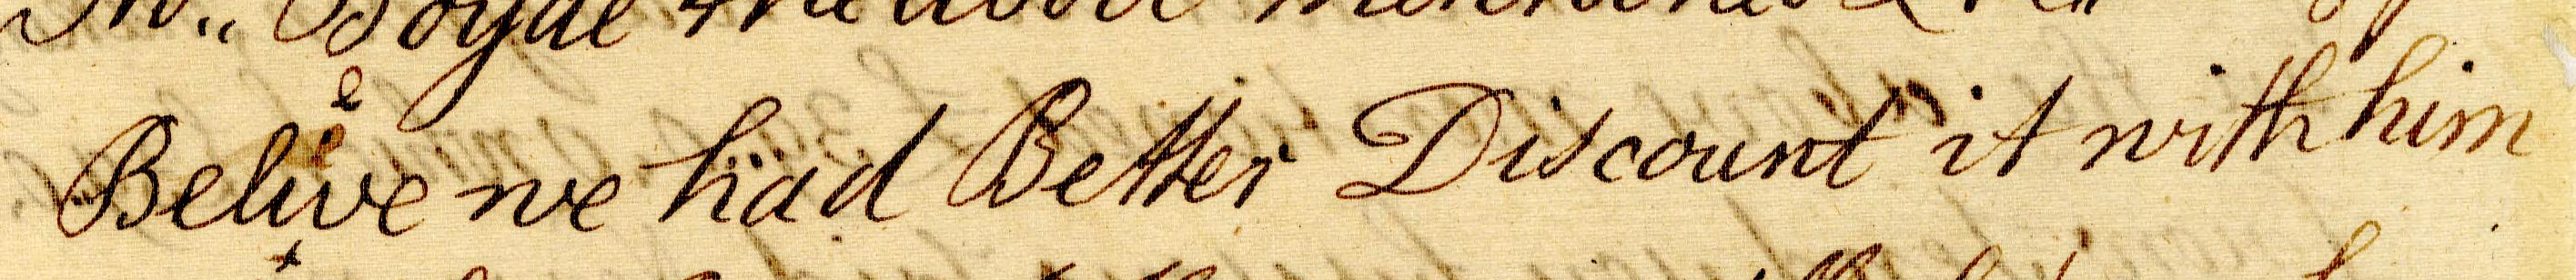Belive we had Better Discount it with him
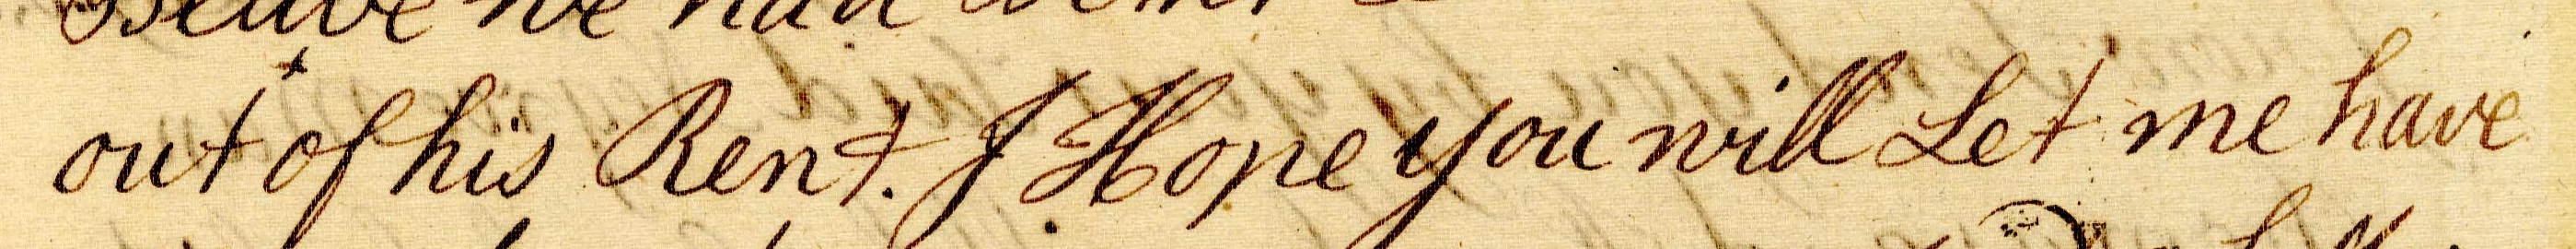out of his Rent. I Hope you will Let me have
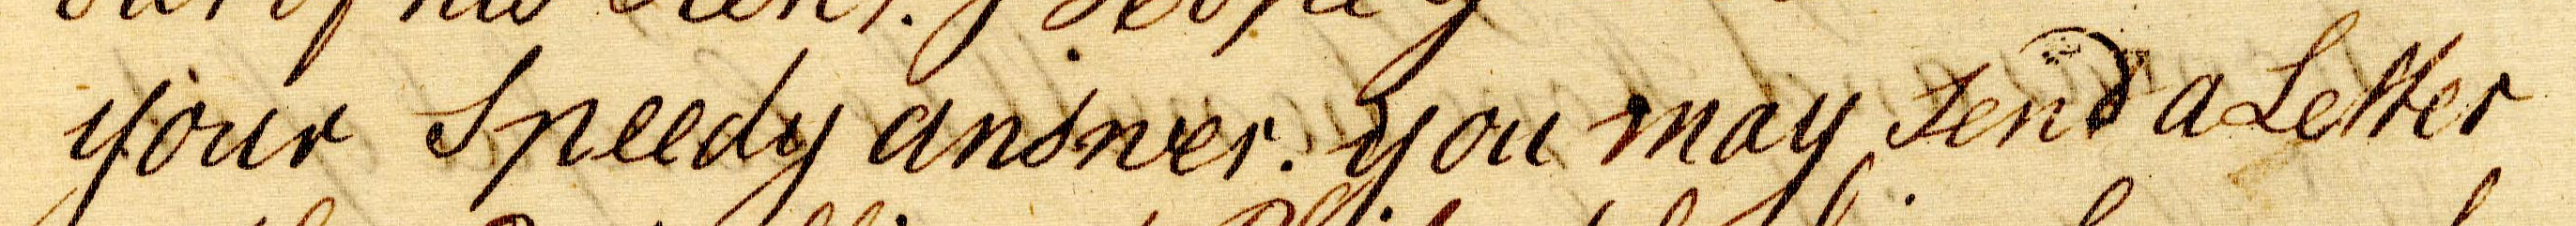Your Speedy answer: you may send a Letter
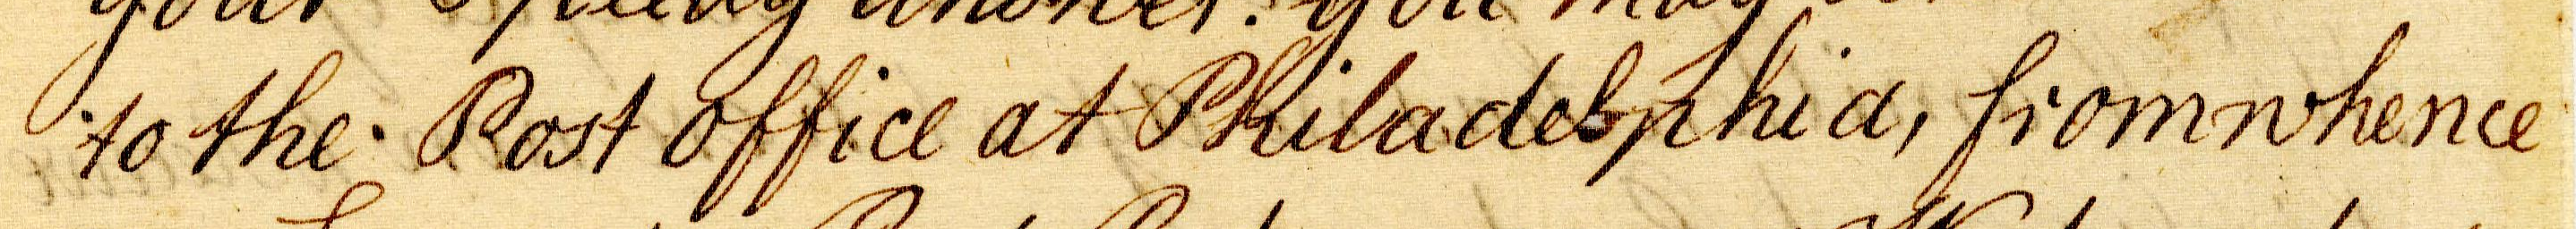to the Post office at Philadelphia, from whence
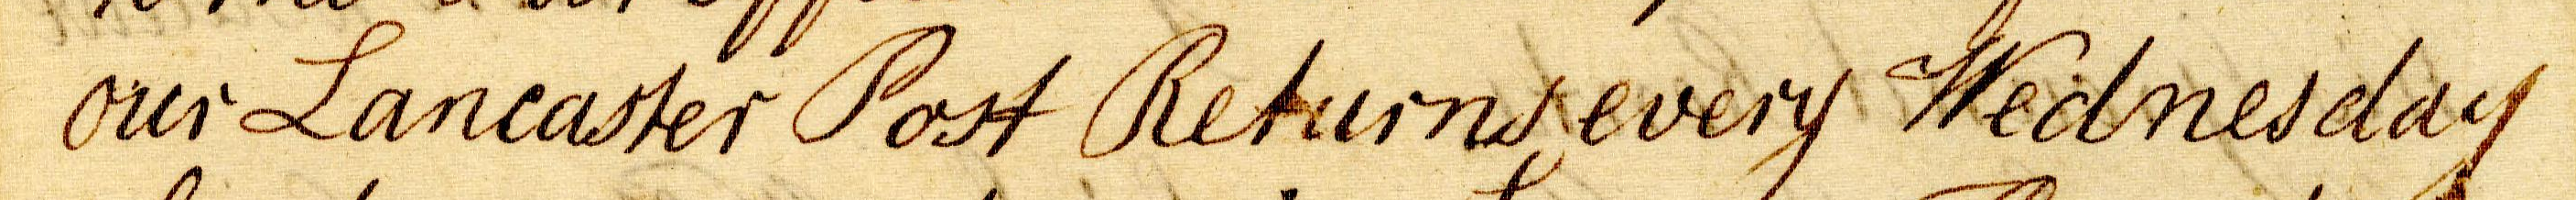our Lancaster Post Returns every Wednesday
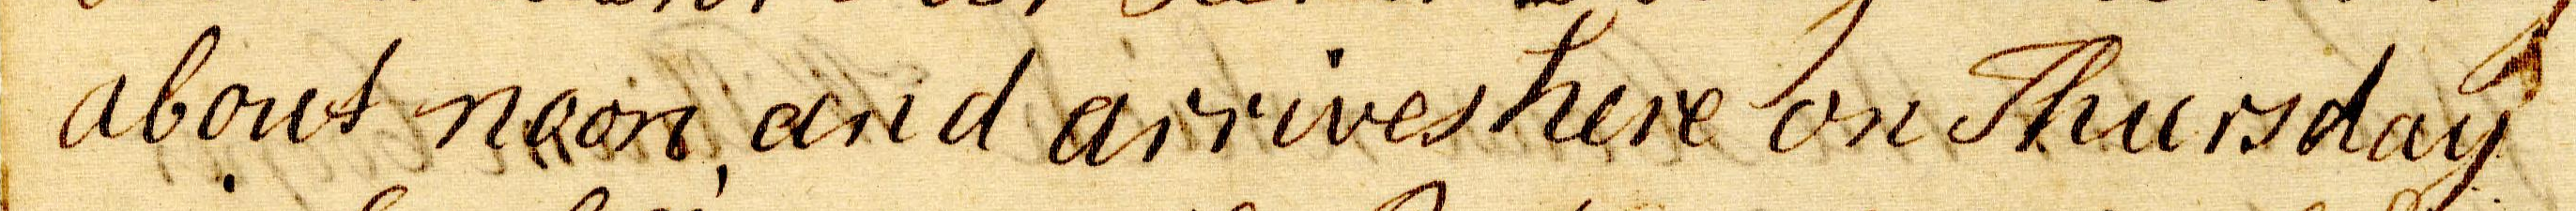about noon and arrives here on Thursday
